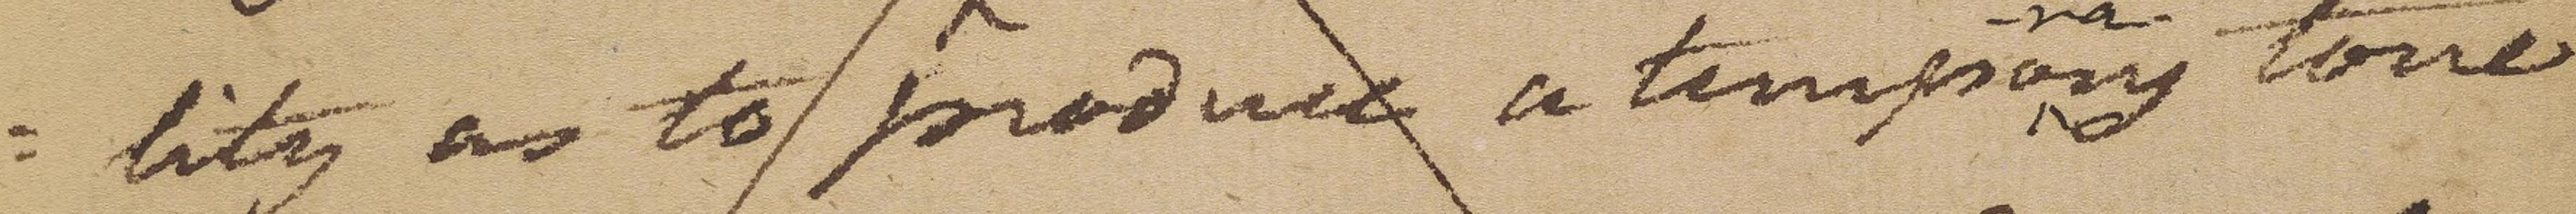-lity as to produce a tempory tone
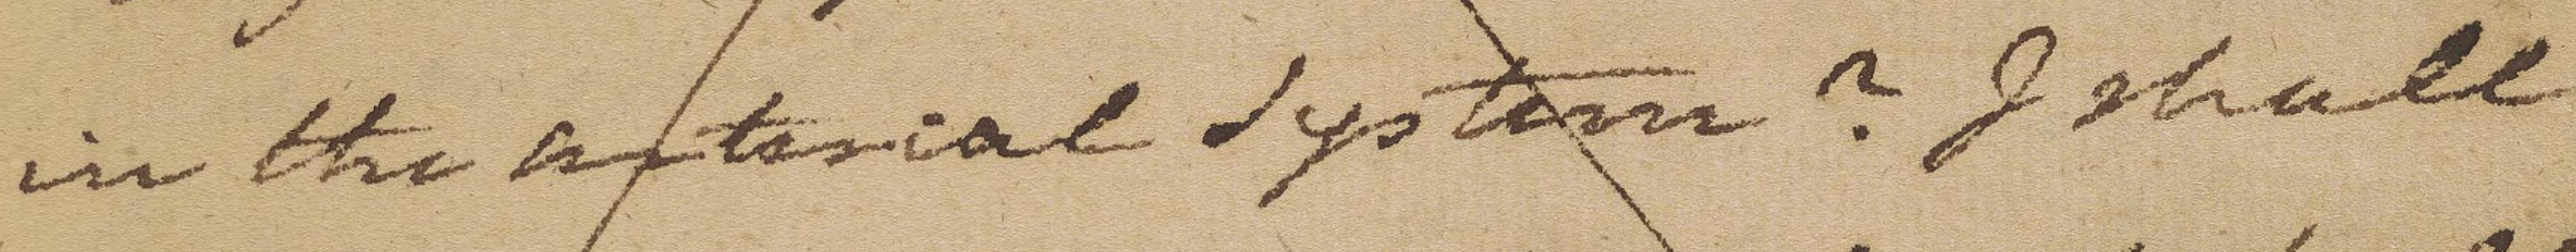in the arterial system? I shall
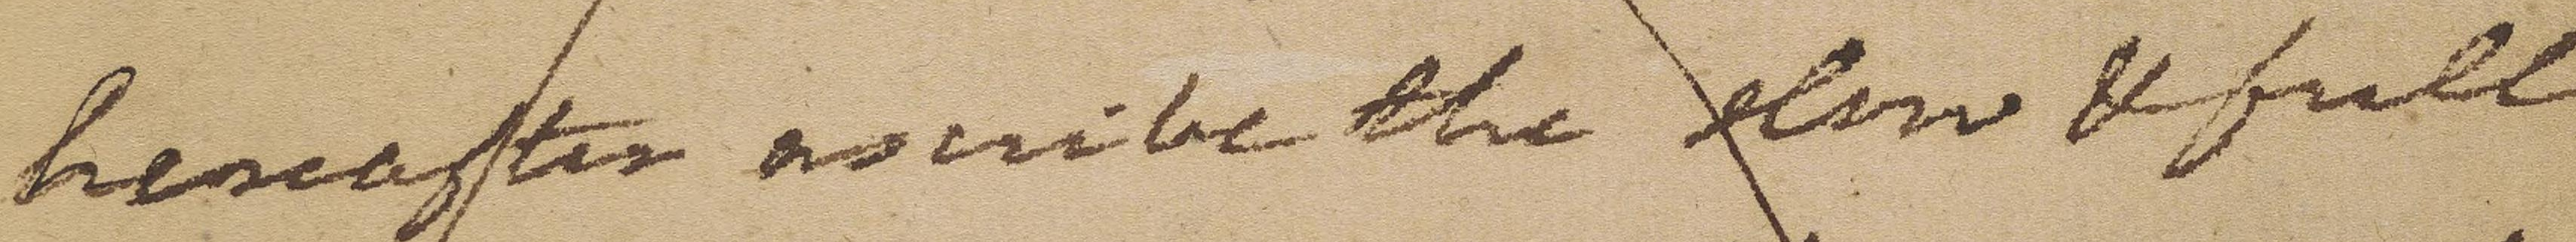hereafter ascribe the slow & full
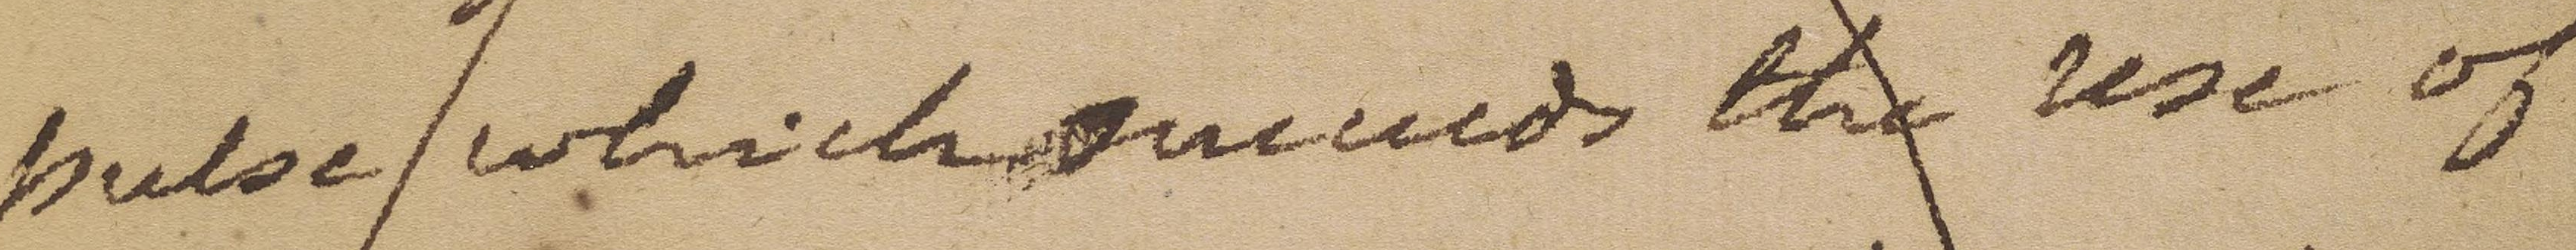pulse which succeeds the use of
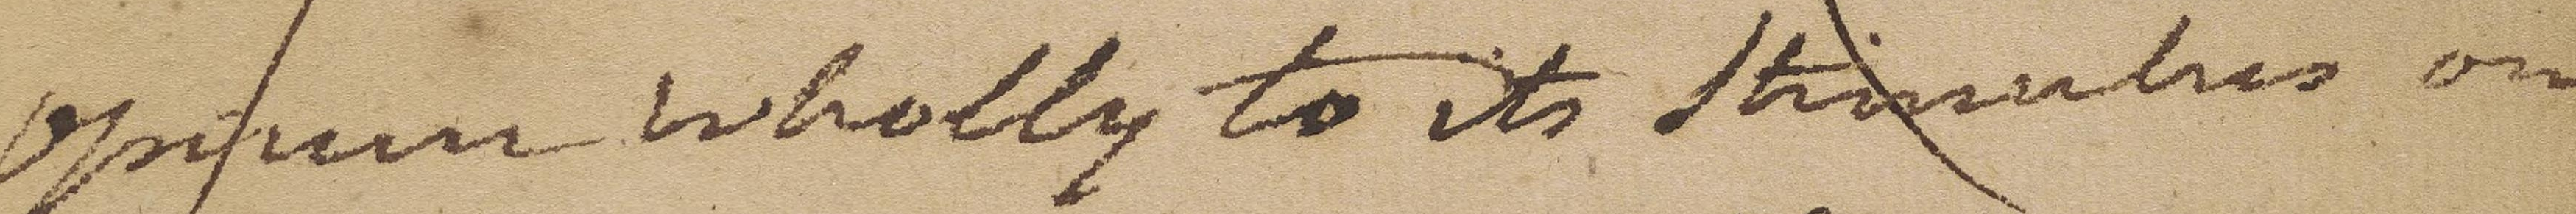opium wholly to its Stimulus on
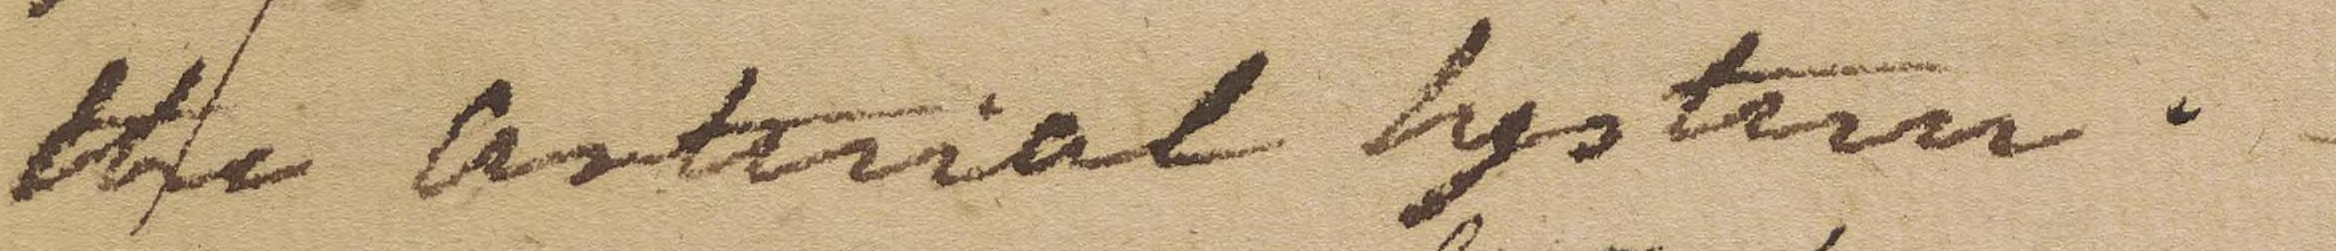the arterial system. V
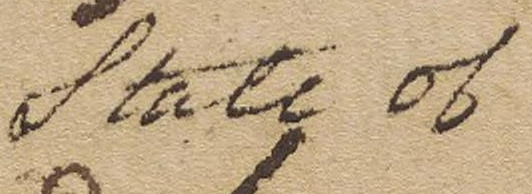State of
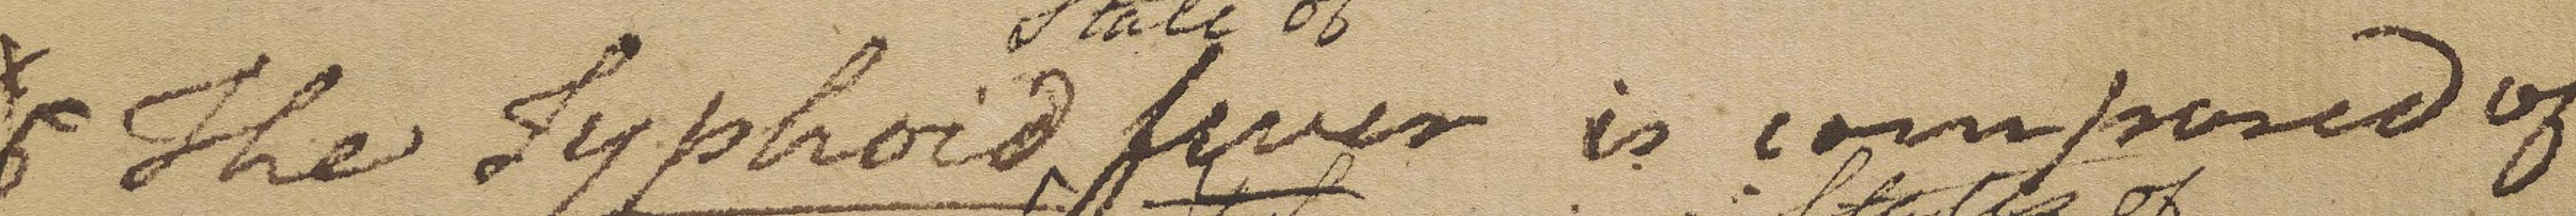The Typhoid ^ fever is composed of
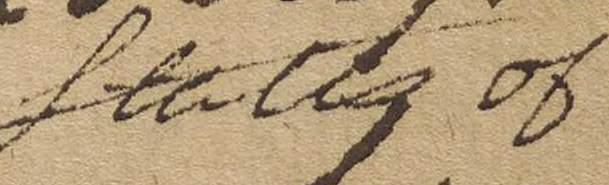States of
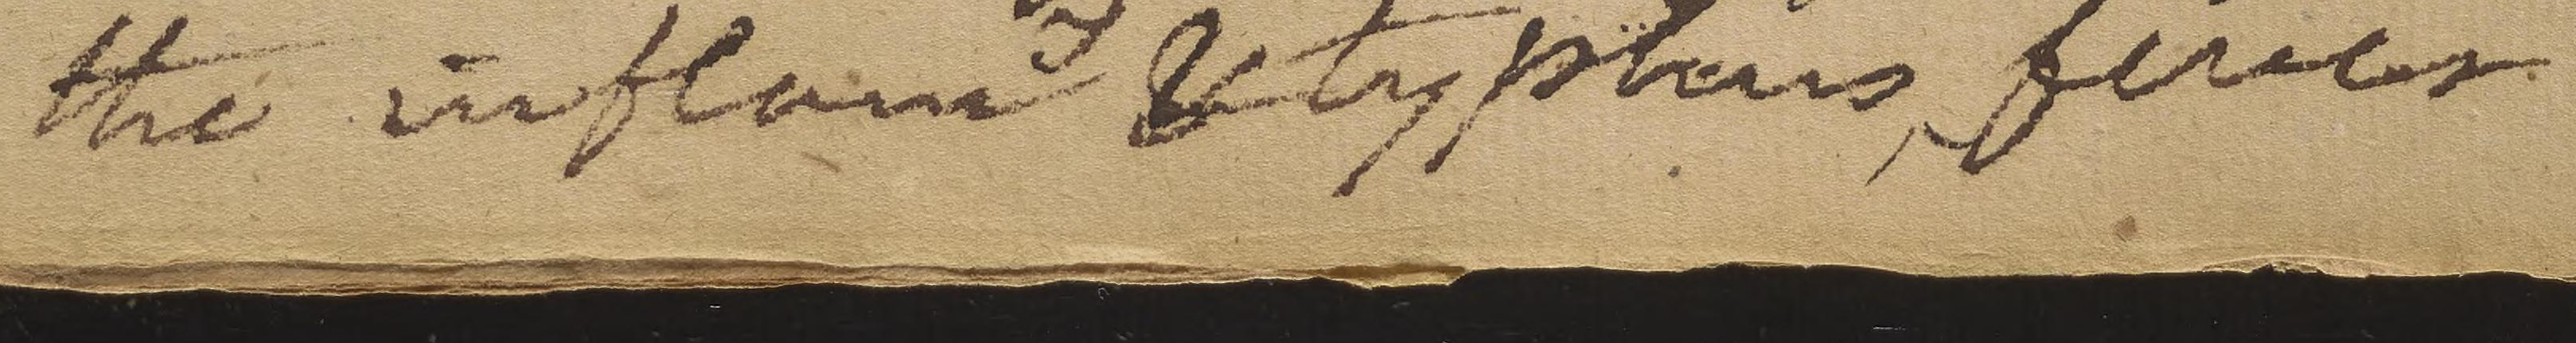the inflam^y & typhus ^ fever.
